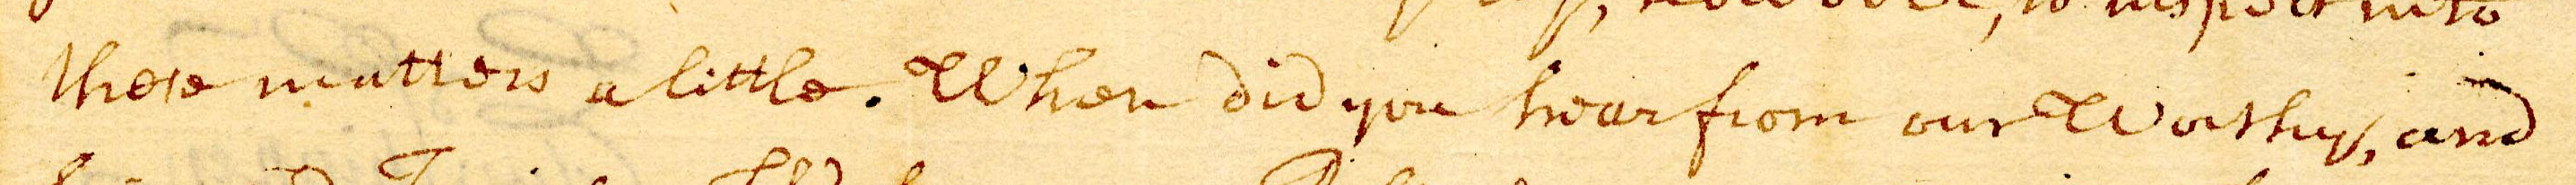those matters a little. When did you hear from our Worthy, and
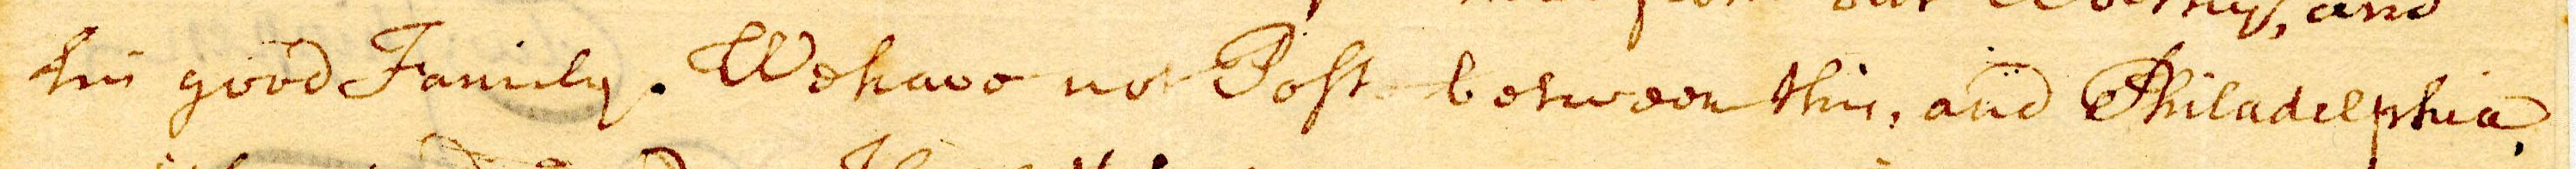his good Family. We have no Post between this, and Philadelphia,
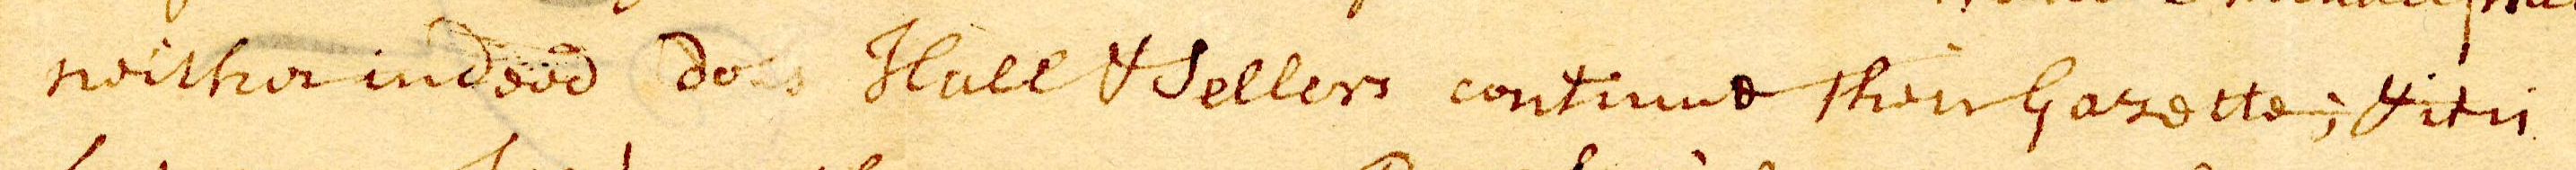neither indeed do Hall & Sellers continue their Gazette; & it is
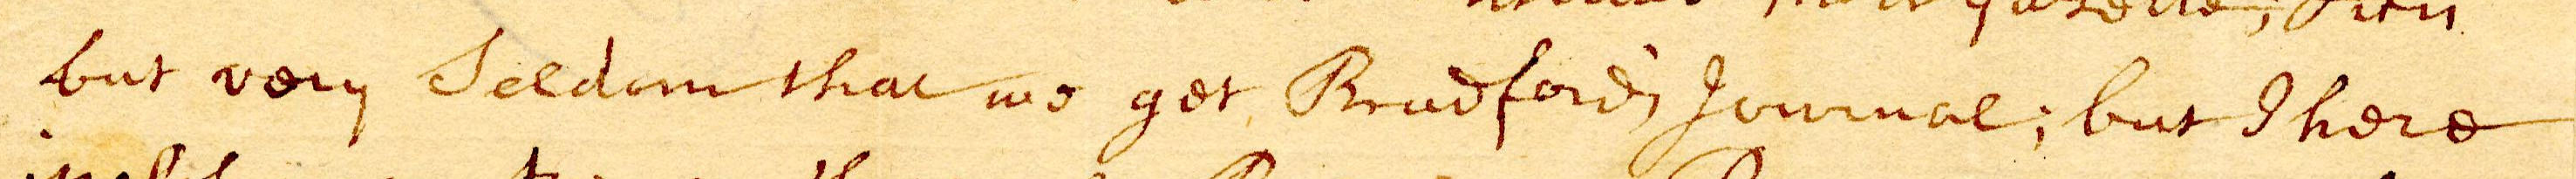but very seldom that we get Bradford's Journal; but I here
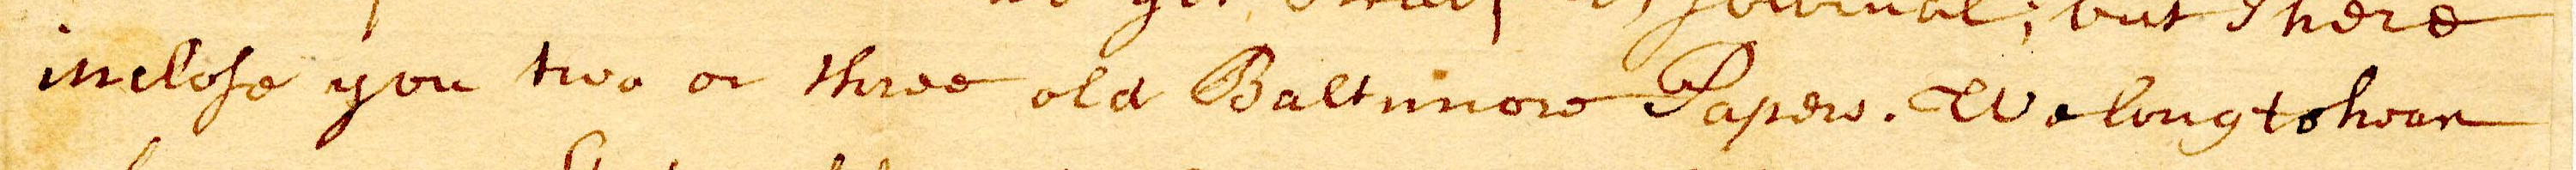inclose you two or three old Baltimore Papers. We long to hear
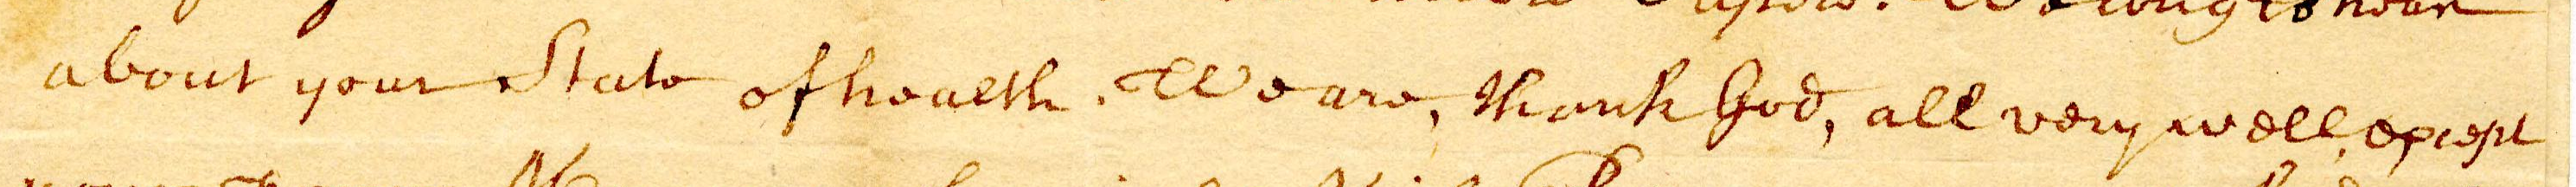about your State of health. We are, thank God, all very well, except
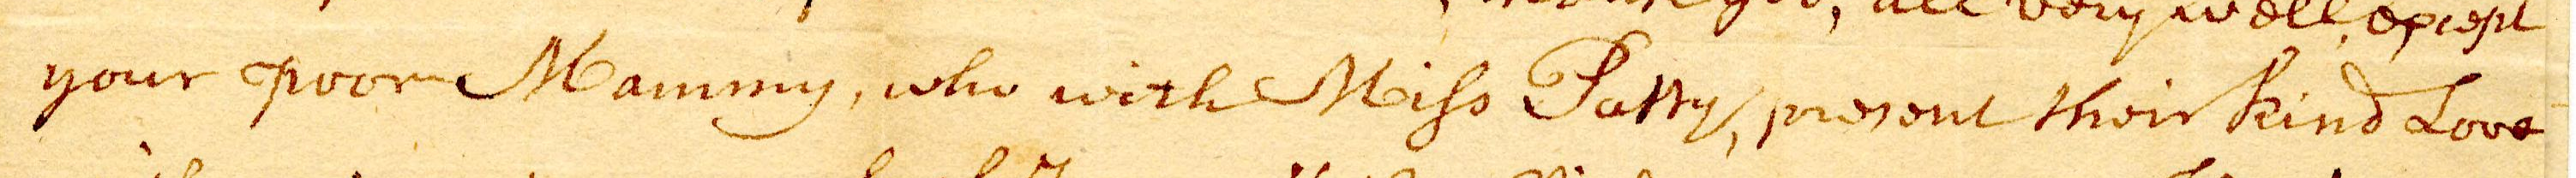your poor Mammy, who with Miss Patty, present their kind Love
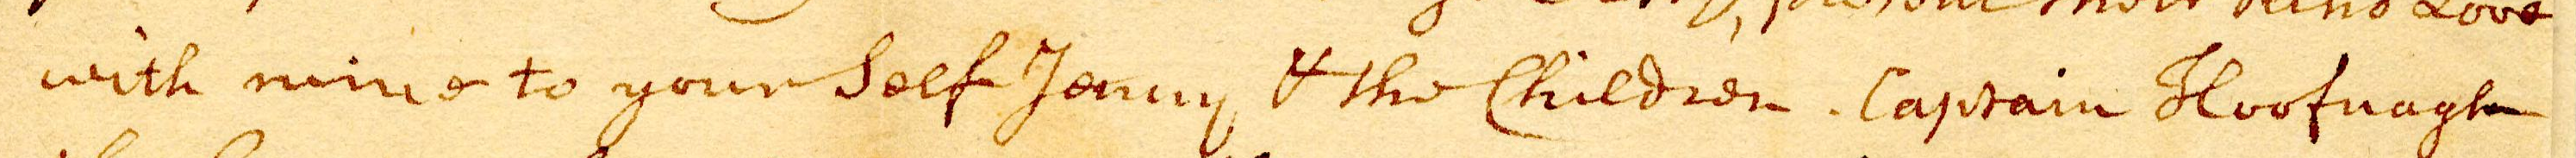with mine to your Self Jenny & the Children. Captain Hoofnagle
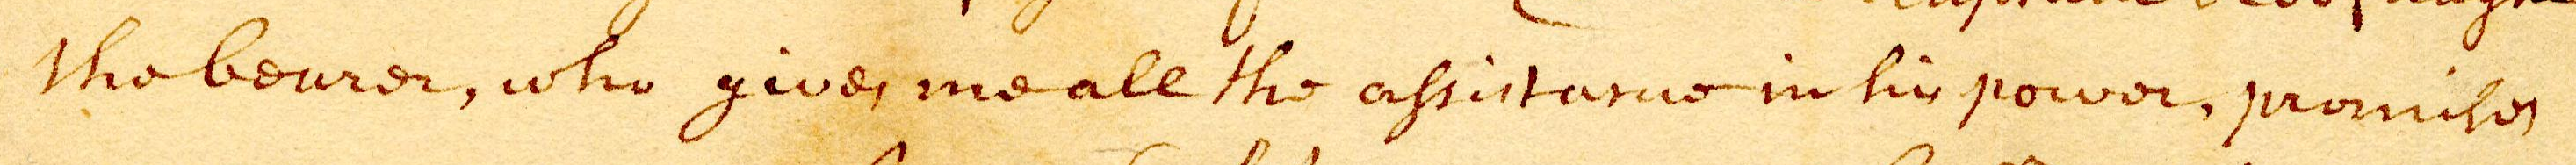the bearer, who gives me all the assistance in his power, promises
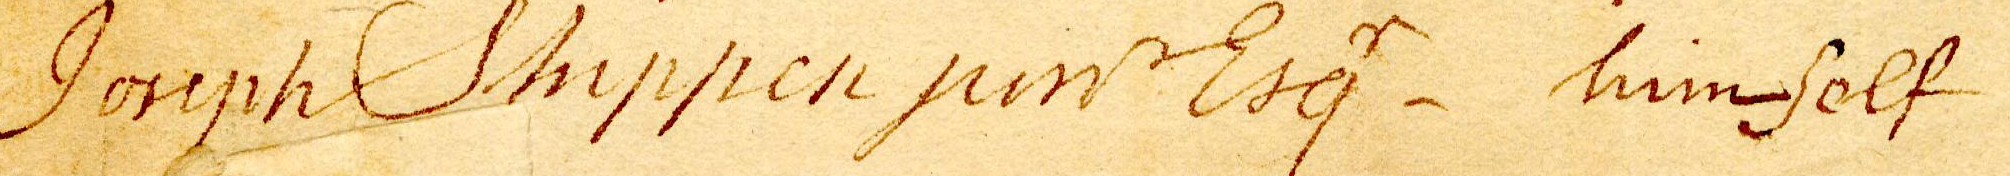Joseph Shippen jun^r Esq^r- himself
